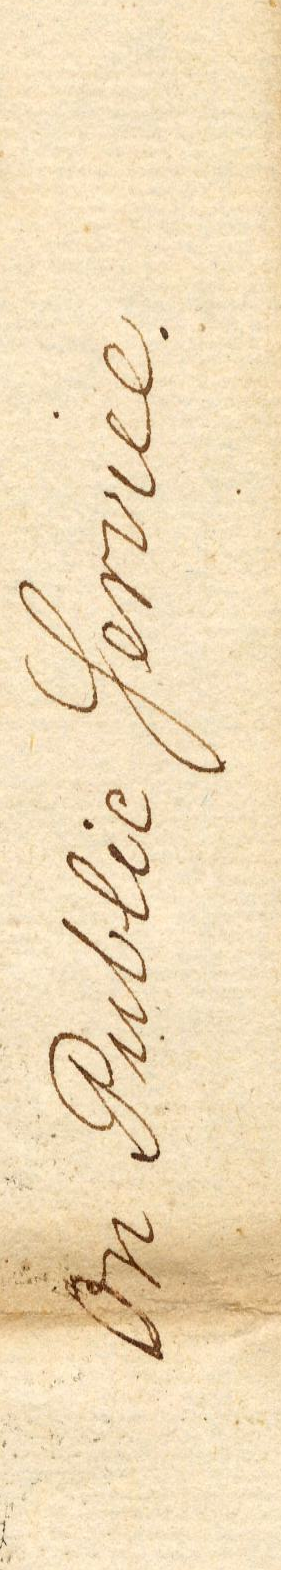On Public Service.
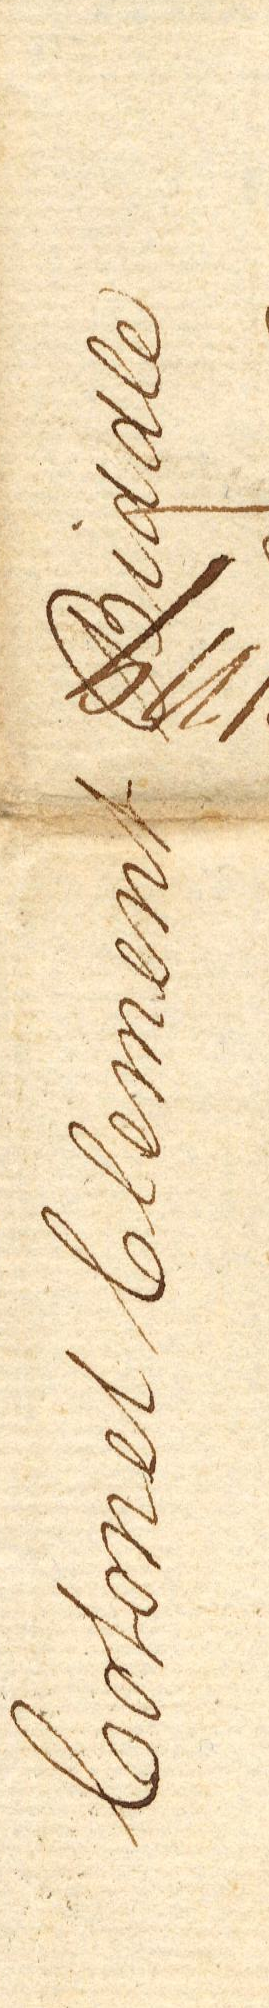Colonel Clement Biddle
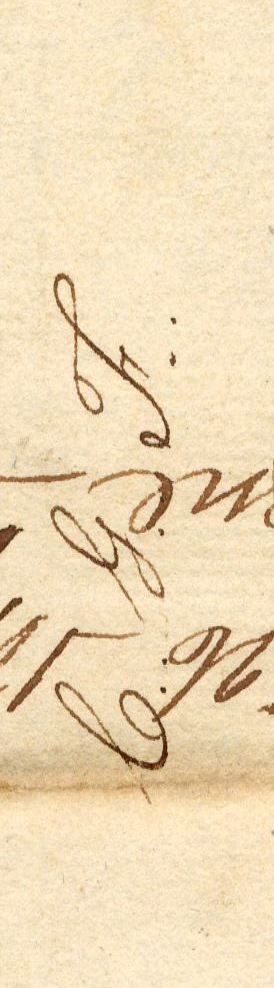C. G. F.
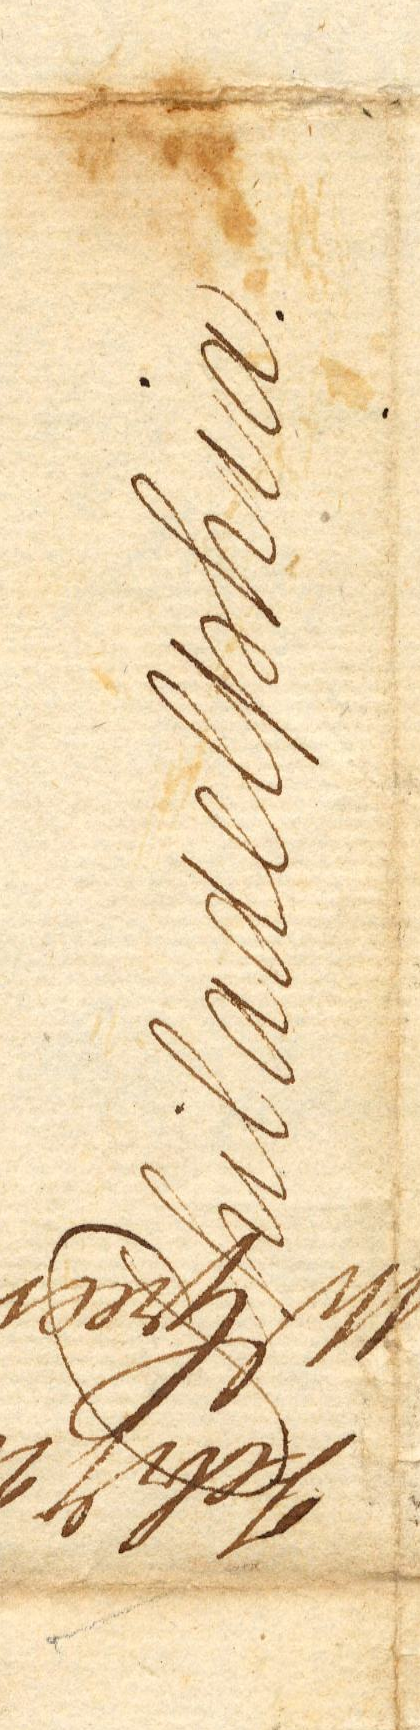Philadelphia
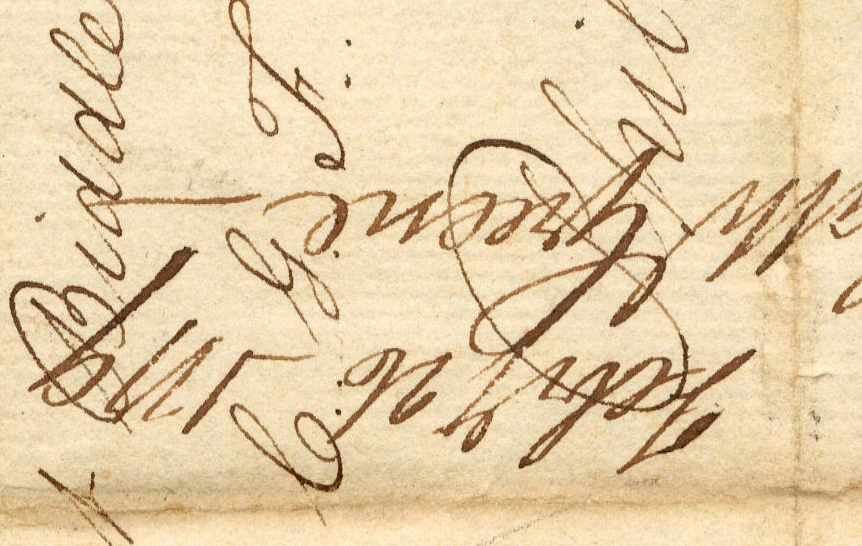Febr^y 26- 1779
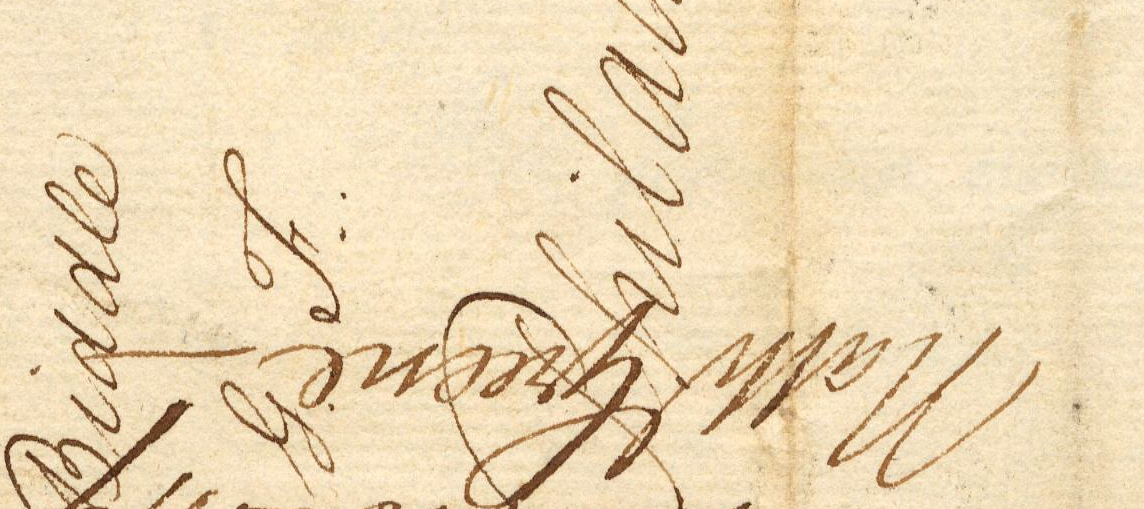Nath^l Greene-
